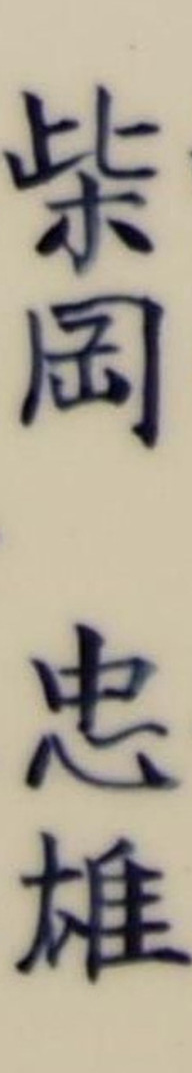柴岡忠雄
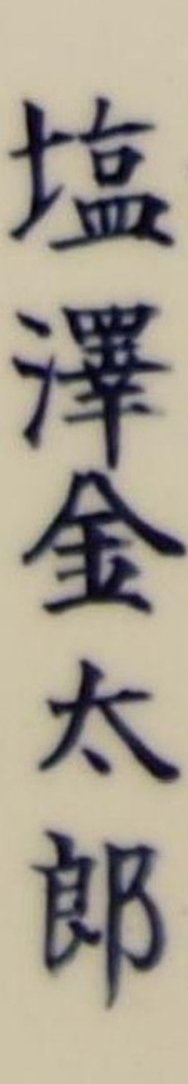塩澤金太郎
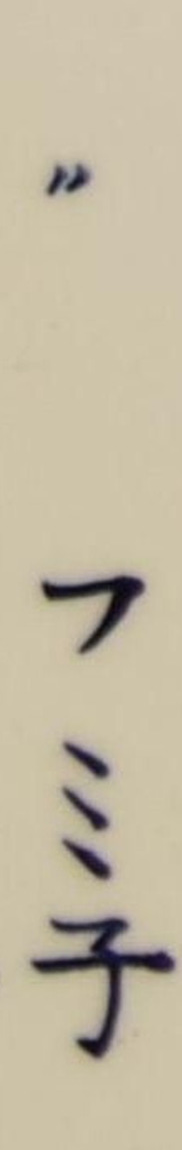フミ子
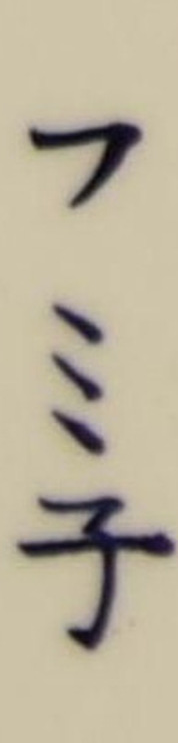フミ子
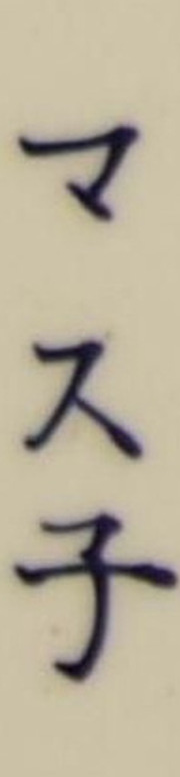マス子

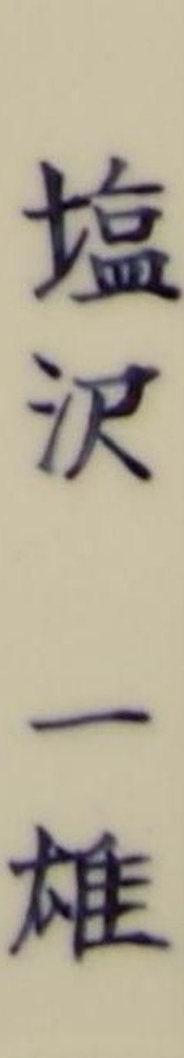塩沢一雄
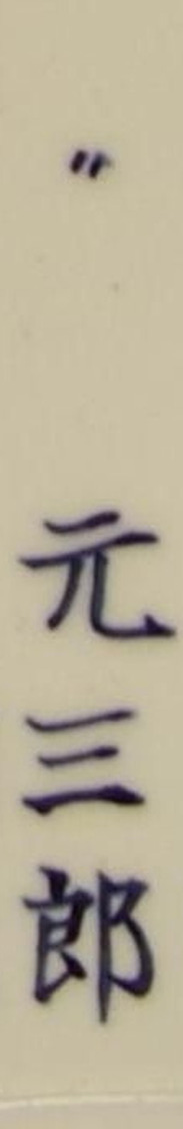元三郎
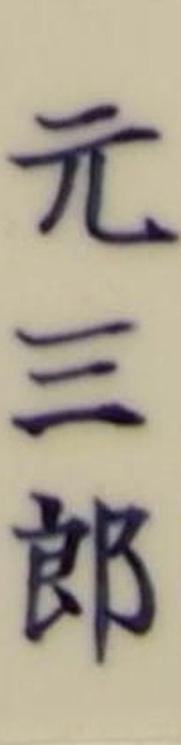元三郎
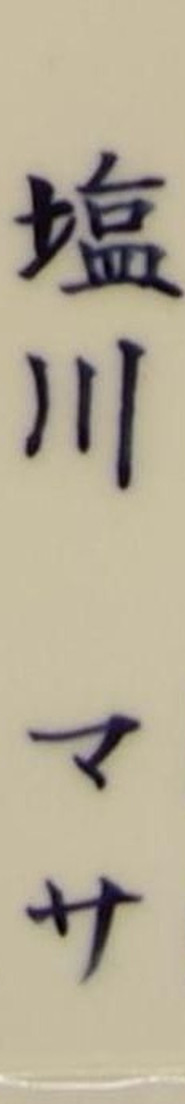塩川マサ
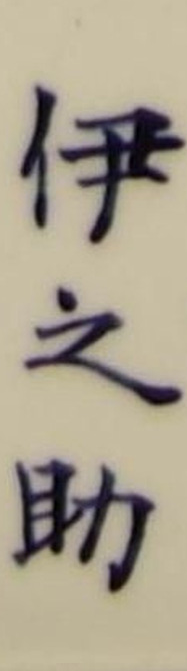伊之助
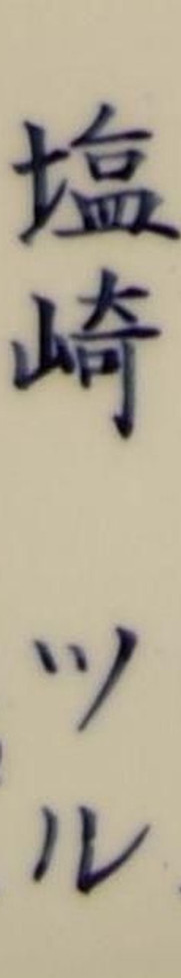塩崎ツル
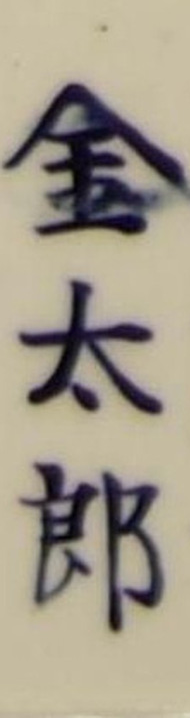金太郎
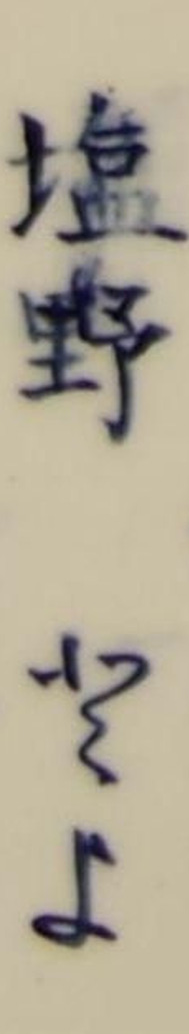塩野とよ
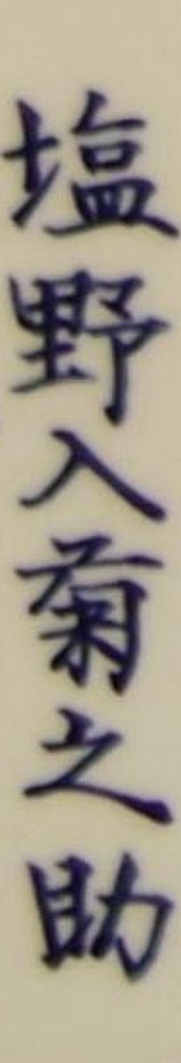塩野入菊之助
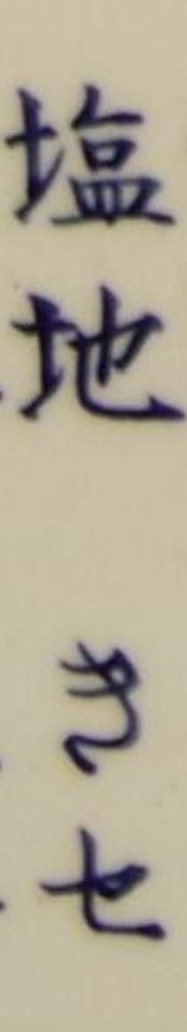塩地きせ
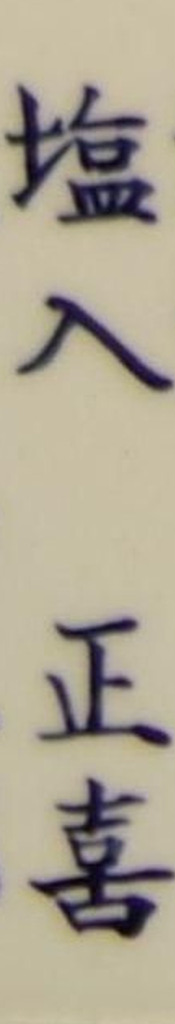塩入正喜
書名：A~D
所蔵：koyasan kongobuji
